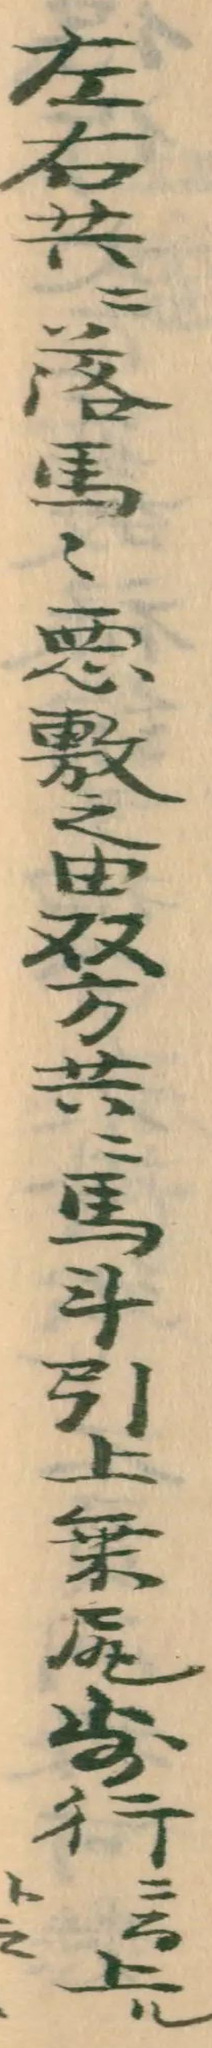左右共ニ落馬々悪敷之由双方共ニ馬計引上乗尻歩行ニ而上ルト云々
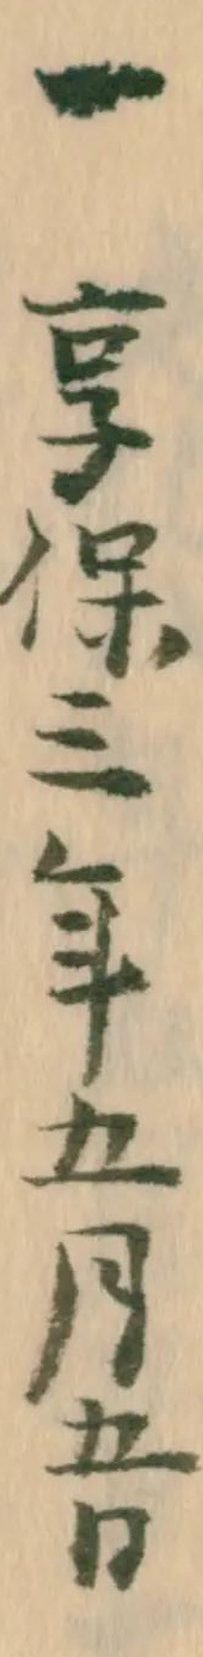一享保三年五月五日
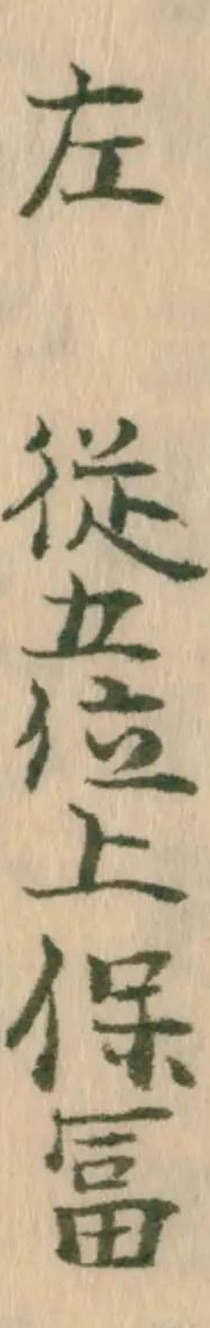左従五位上保富
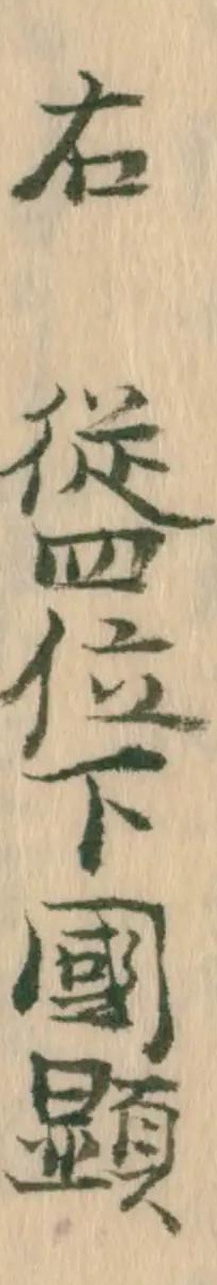右従四位下国顕
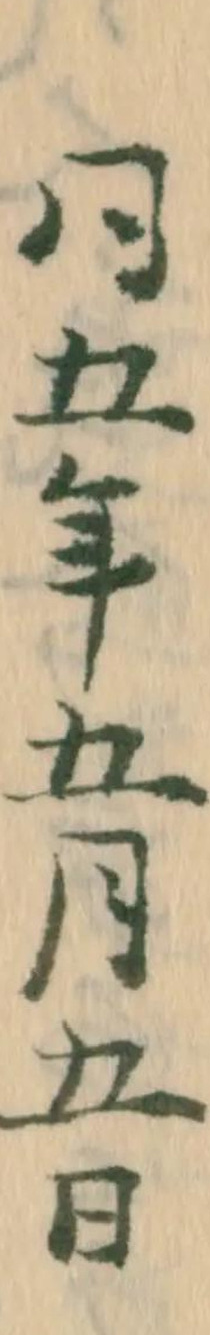一同五年五月五日
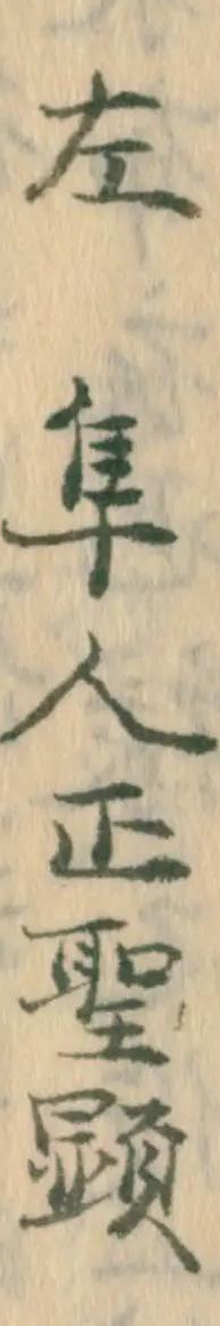左隼人正聖顕
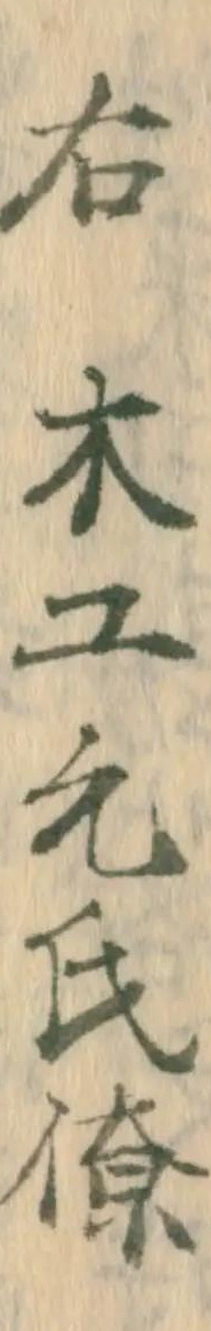右木工允氏僚
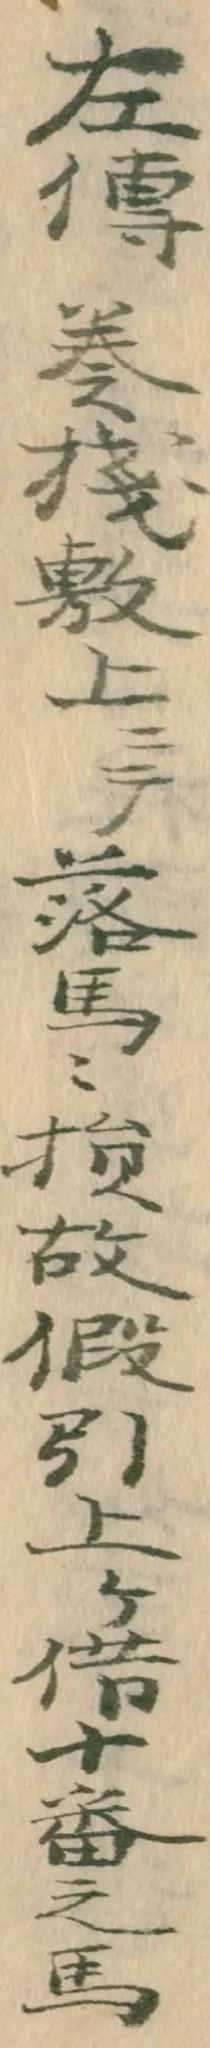左伝奏桟敷上ニテ落馬ニ損故仮引上ケ借十番之馬
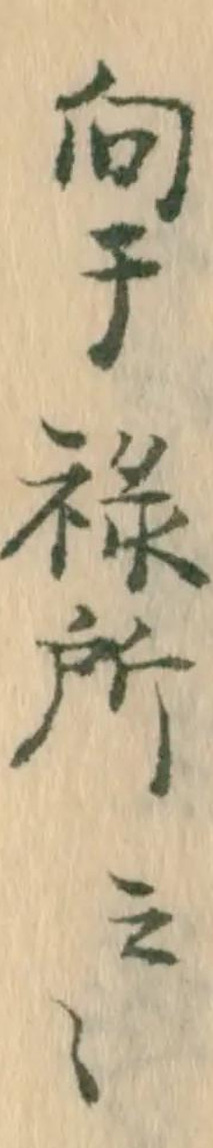向于禄所云々

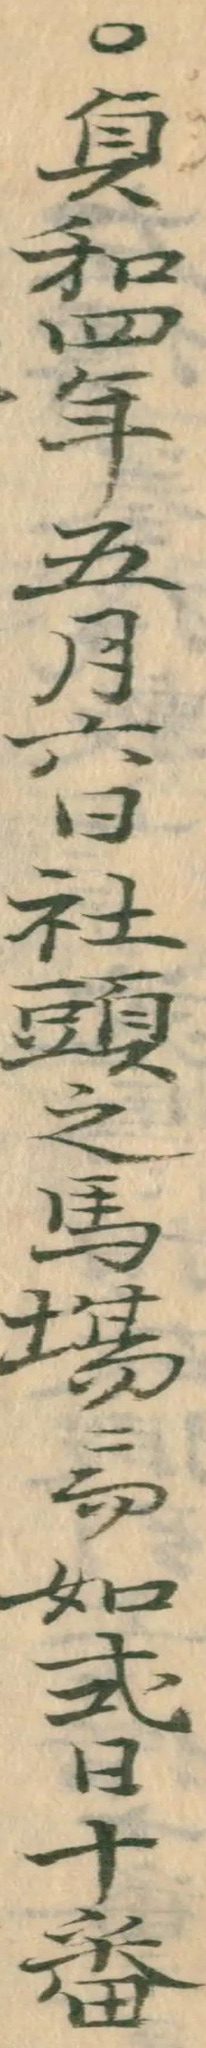○貞和四年五月六日社頭之馬場ニ而如式日十番
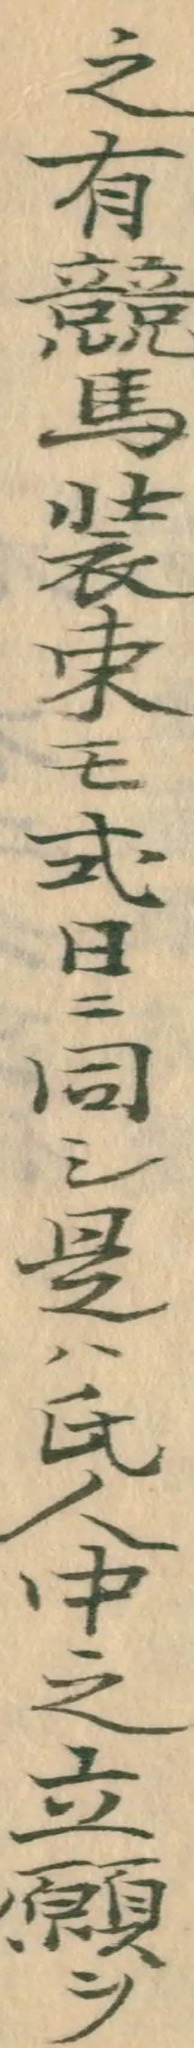之有競馬装束モ式日ニ同シ是ハ氏人中之立願ヲ
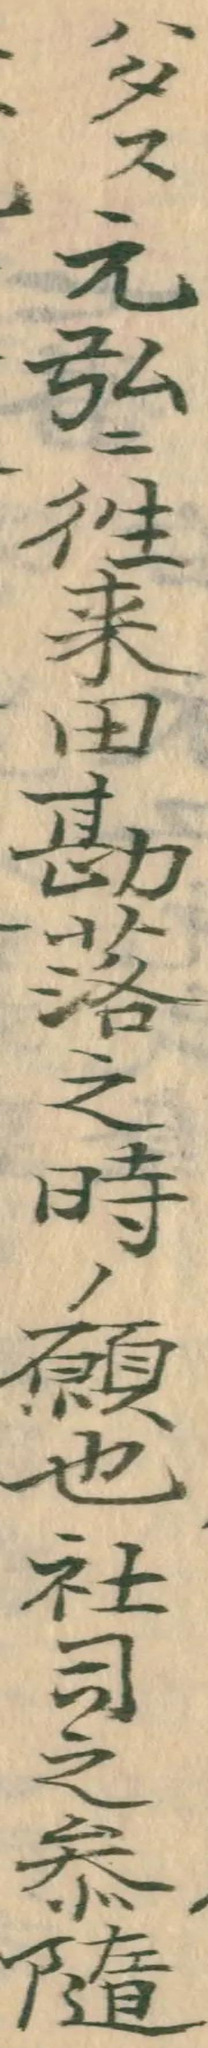ハタス元弘ニ往来田勘落之時ノ願也社司之参随
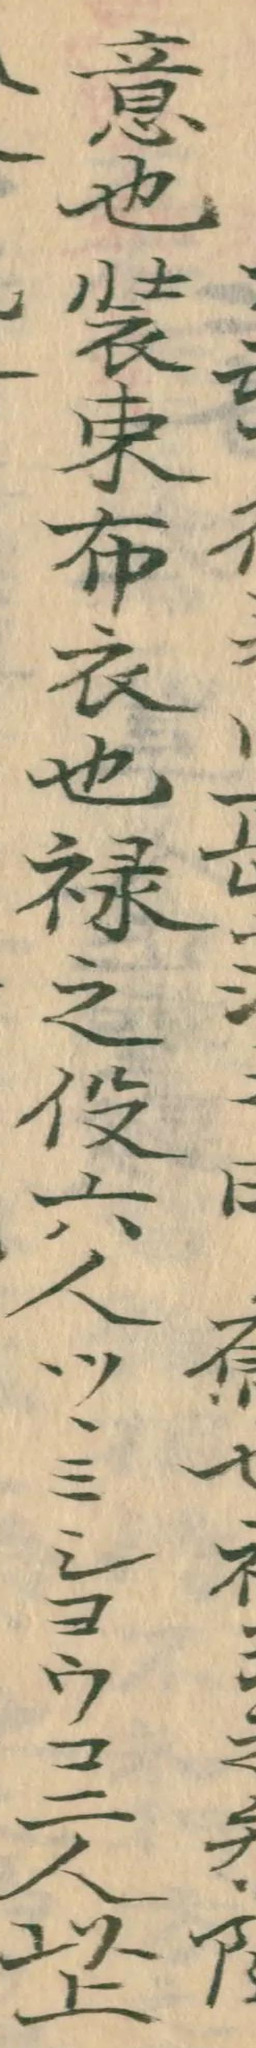意也装束布衣也禄之役六人ツヽミシヨウコ二人以上
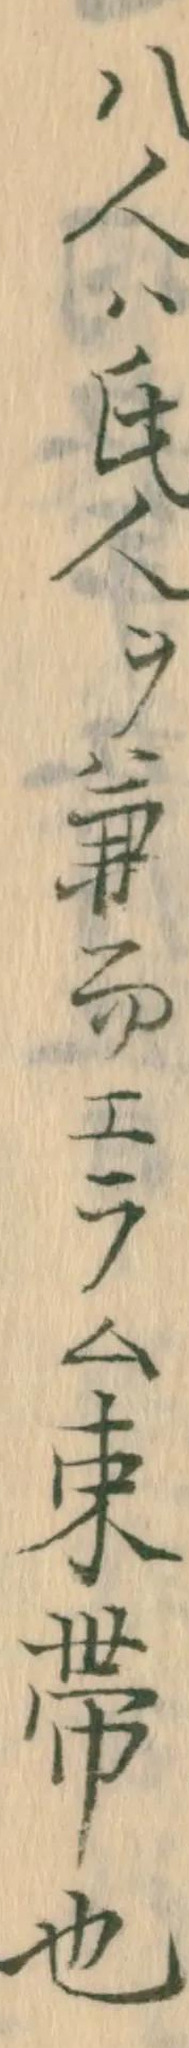八人ハ氏人ヲ兼而エラム束帯也
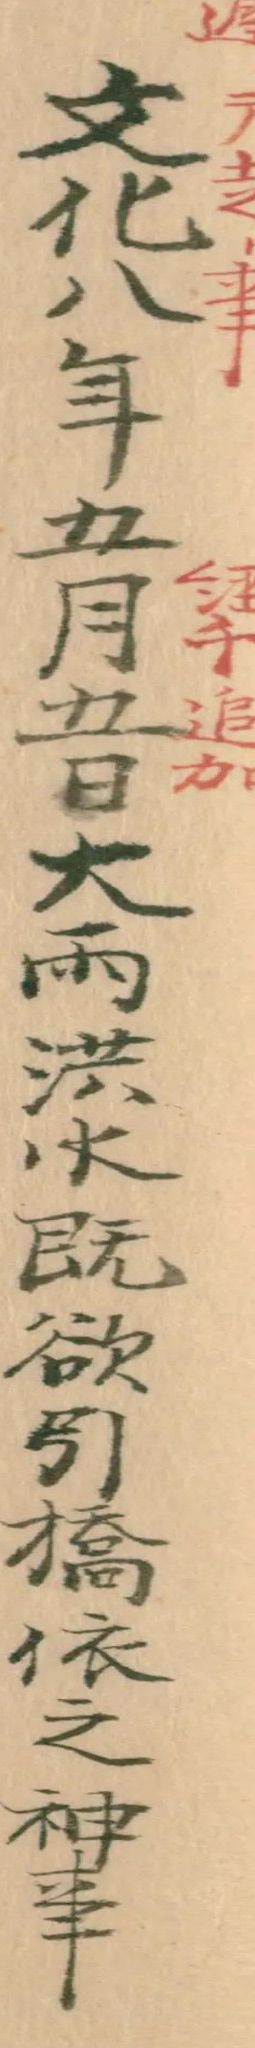一文化八年五月五日大雨洪水既欲引橋依之神事
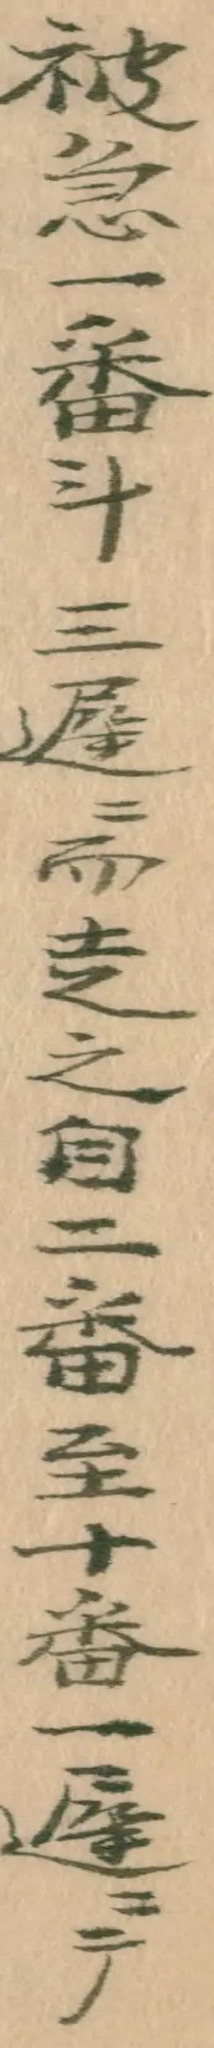被急一番斗三遅ニ而走之自二番至十番一遅ニテ
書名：賀茂社記録. 第12冊
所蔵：国立国会図書館 National Diet Library, JAPAN
